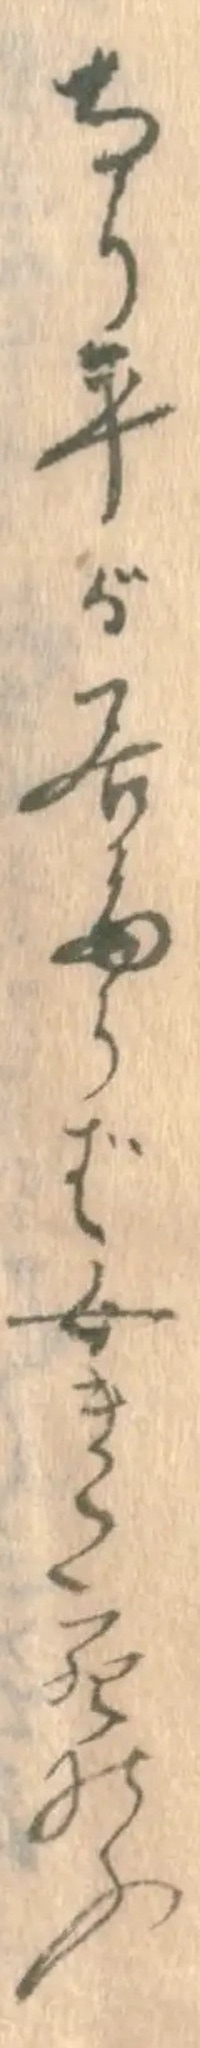なり平が居たらば女また死のふ
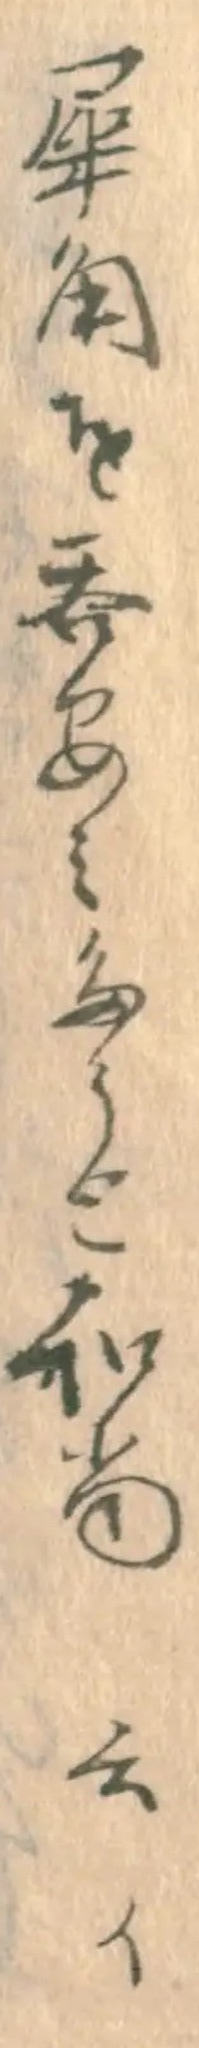犀角を呑あみたうと和尚云イ
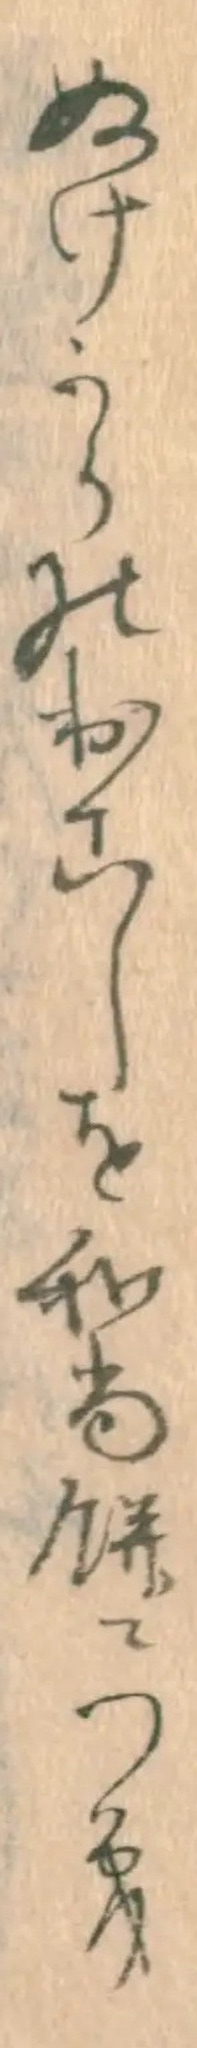ぬけからのおこしを和尚餅につき
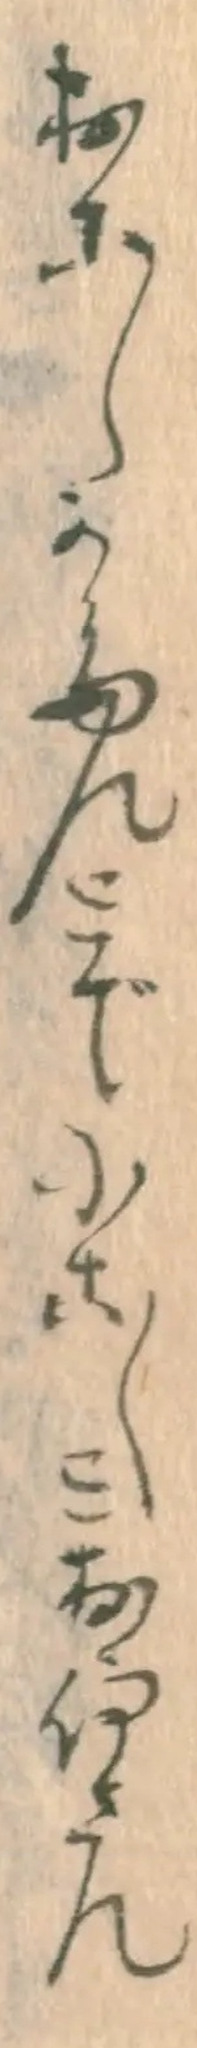おこしかたんとでにこにことお？さん
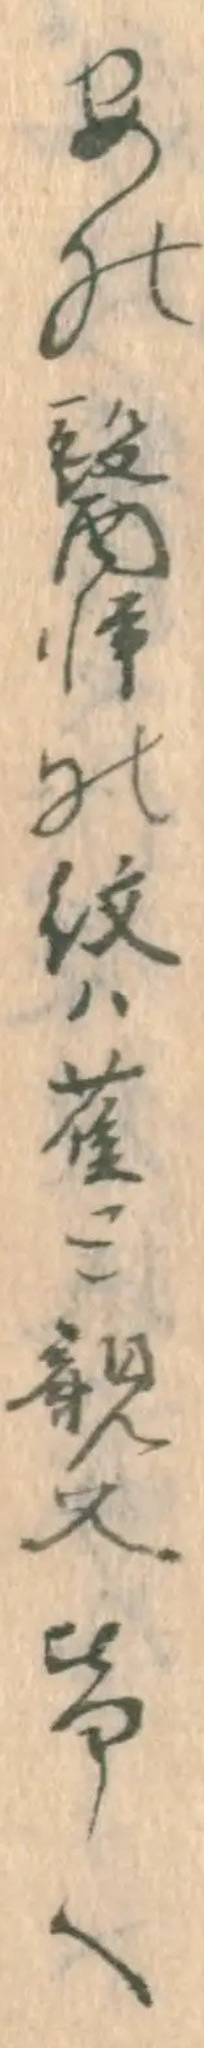あの医師の紋は雀と親父皆へ
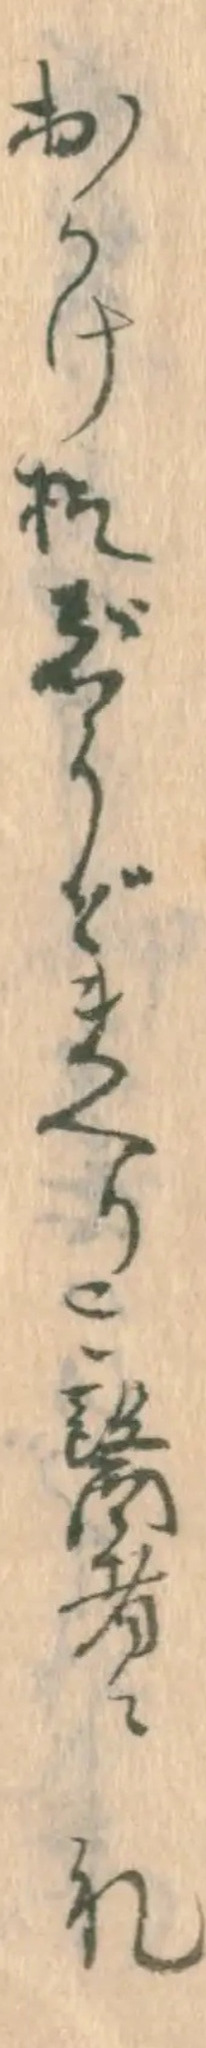おかけ様じうどまへりと医者に礼
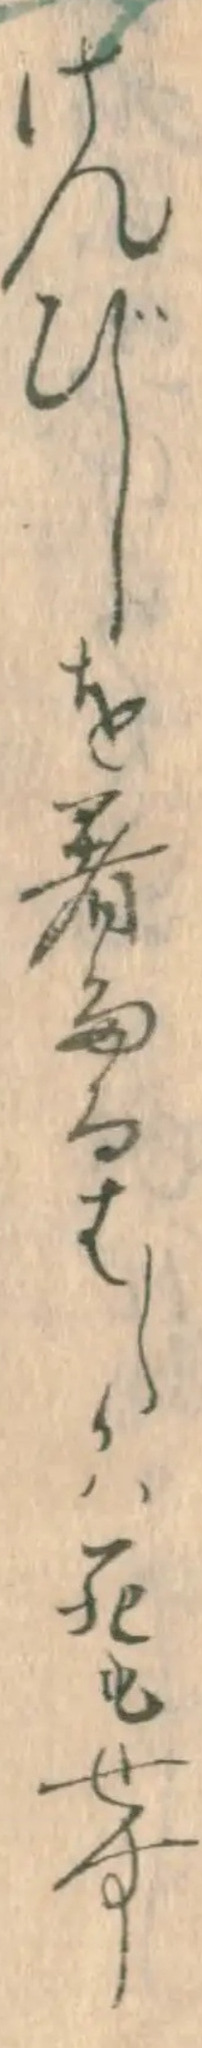けんびしを着たるはしかハ死もせす
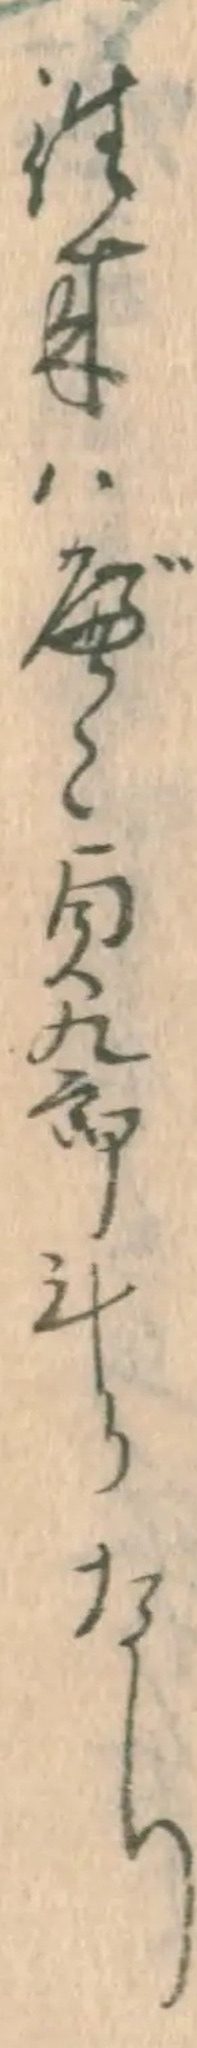往来ハべた貞九郎斗りなり
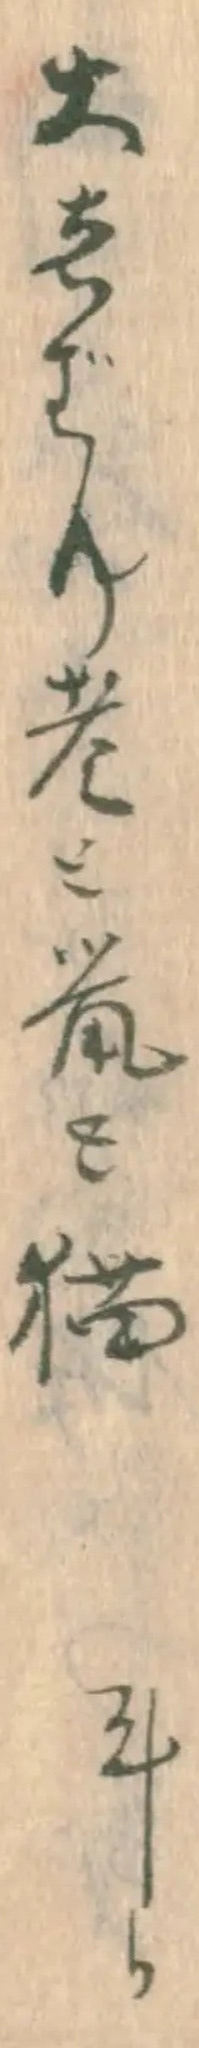大者ばん老と鼠と猫斗り
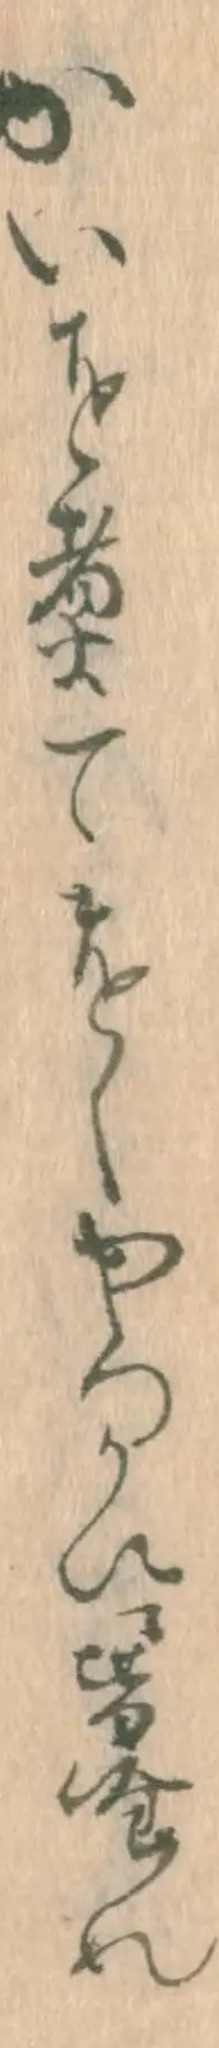かいを煮てをくやつかいに皆喰れ
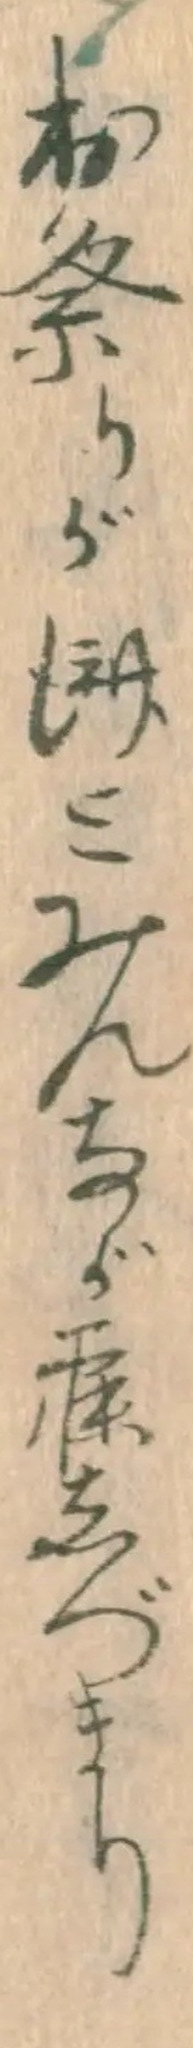お祭りが済とみんなが寝しづまり
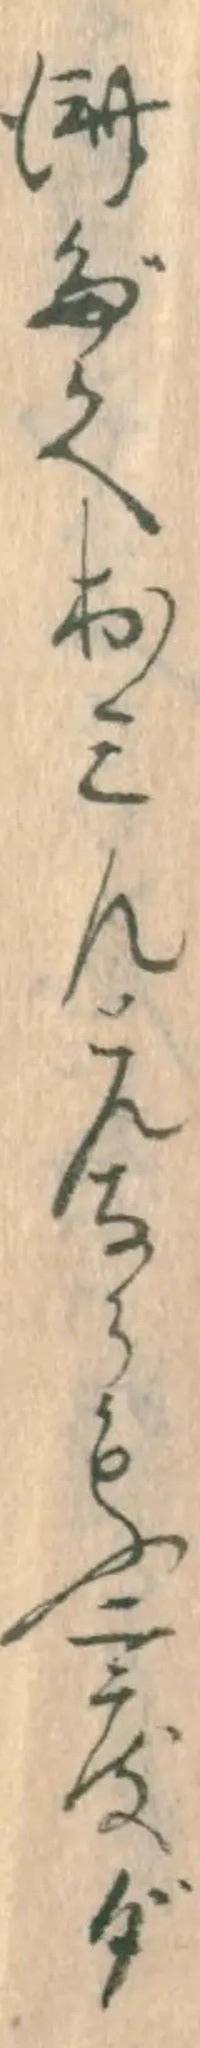済だかへおとんとんならもふ二度ダ
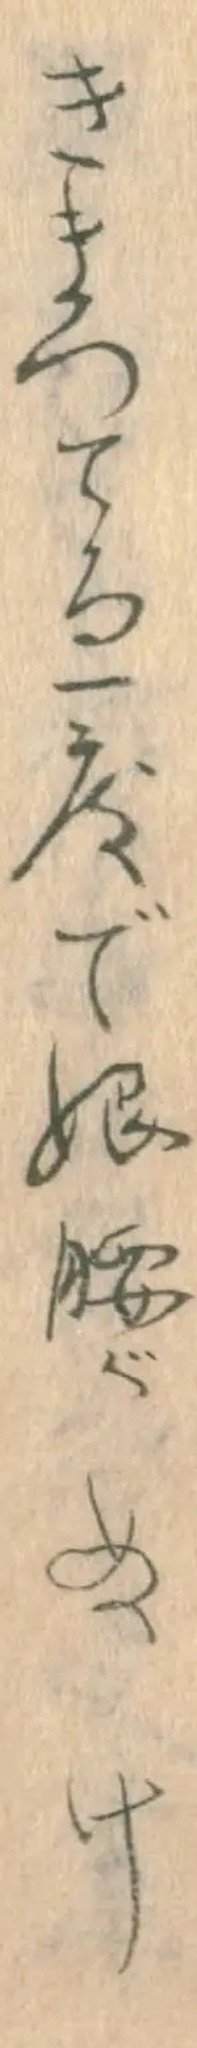きまつてる一度で娘腰がぬけ
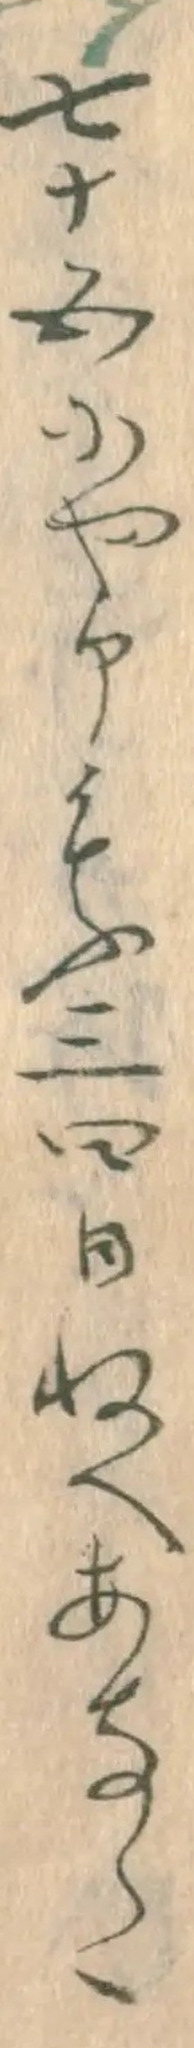七十五にやァもふ三四日ねへあなた
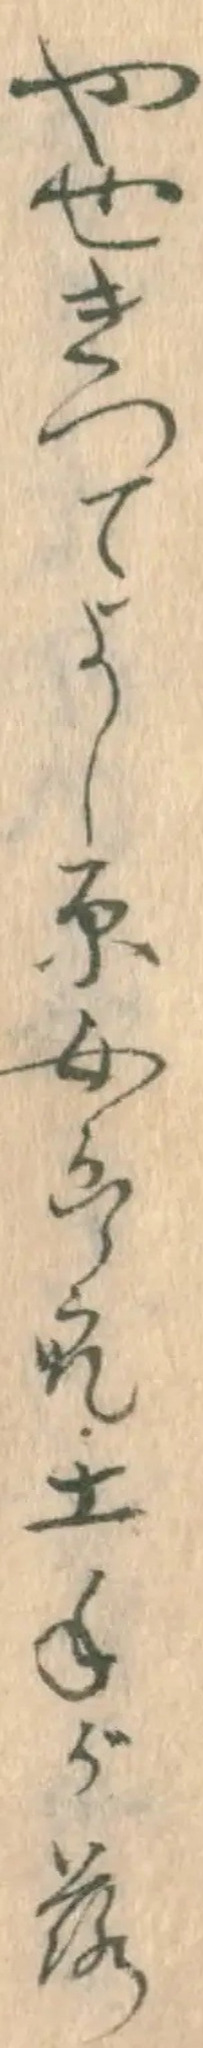やせきつてよし原女郎衆土手が落
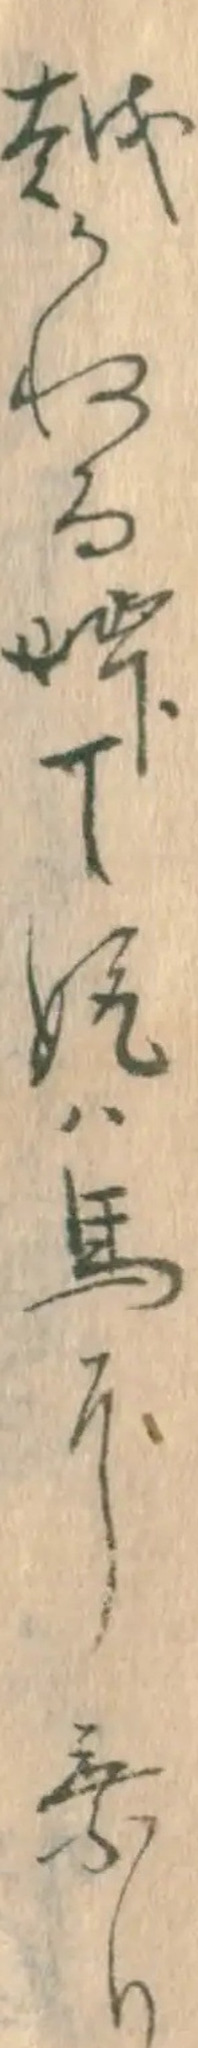越かねる峠て娵ハ馬に乗り
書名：麻疹後柳樽
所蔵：国立国会図書館 National Diet Library, JAPAN
